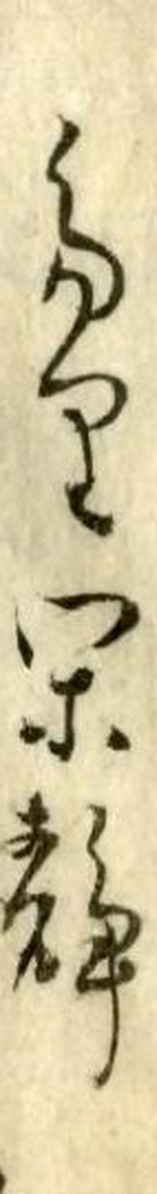たり閑静
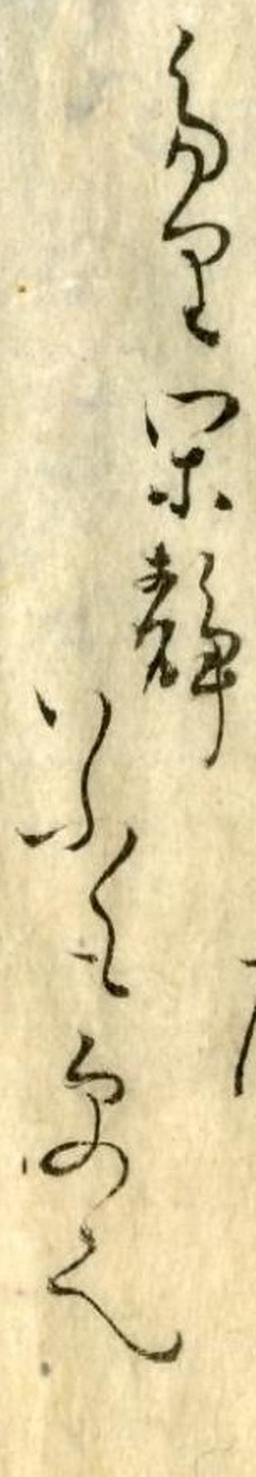いふも更也
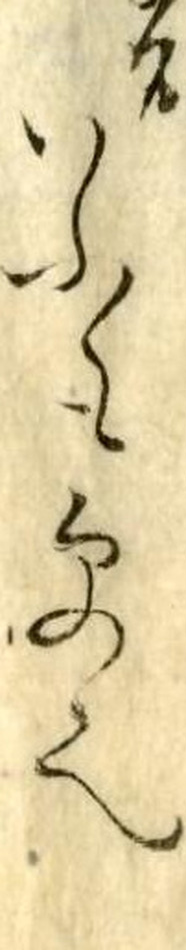いふも更也
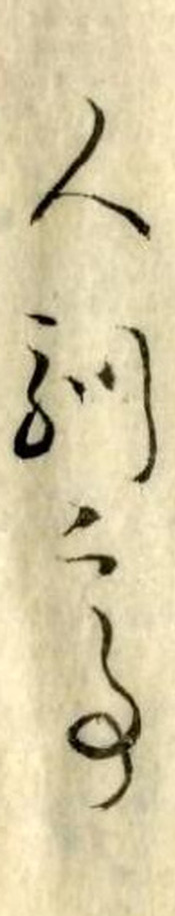人馴て

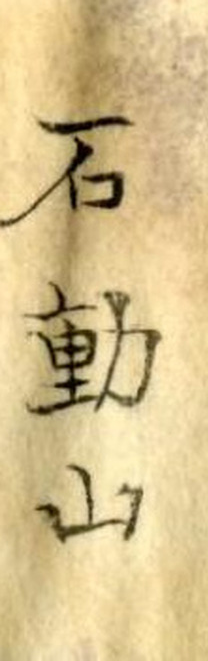石動山
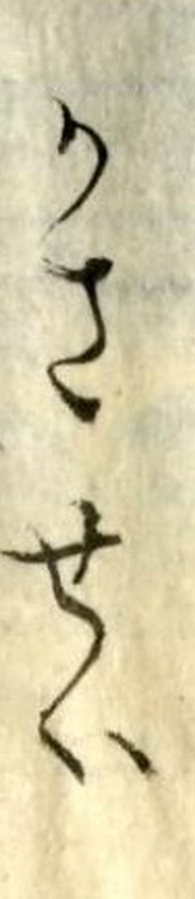かさせは

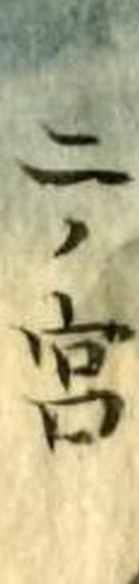二ノ宮
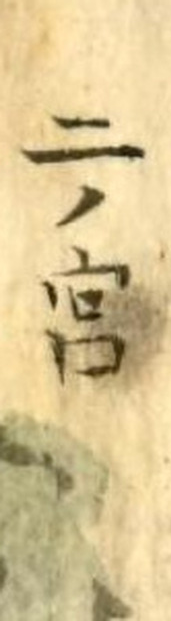二ノ宮
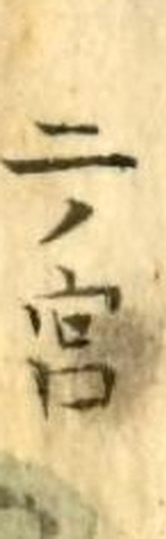二ノ宮
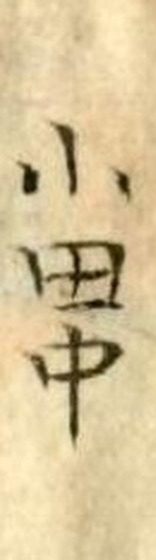小田中

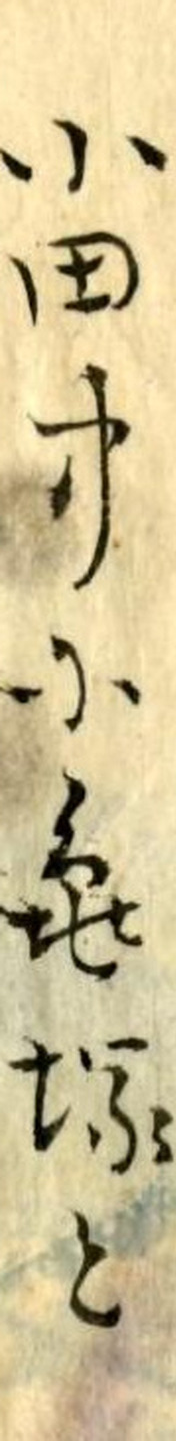小田中に亀塚と
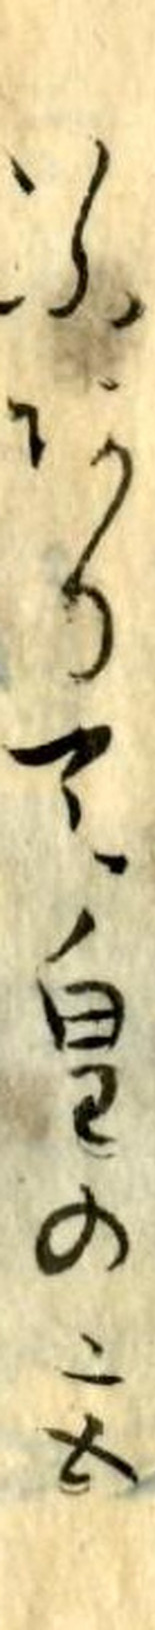いふありて皇の宮
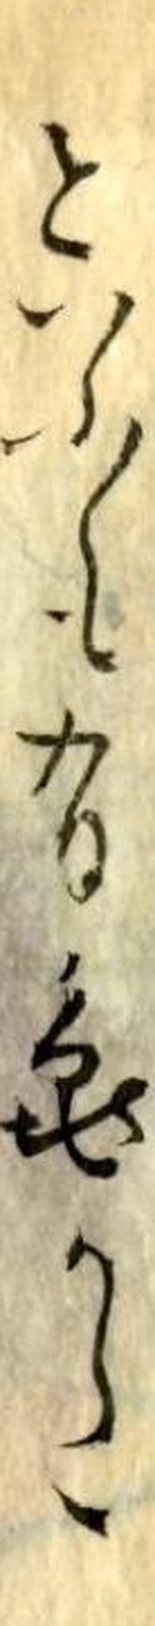といふも有亀かた
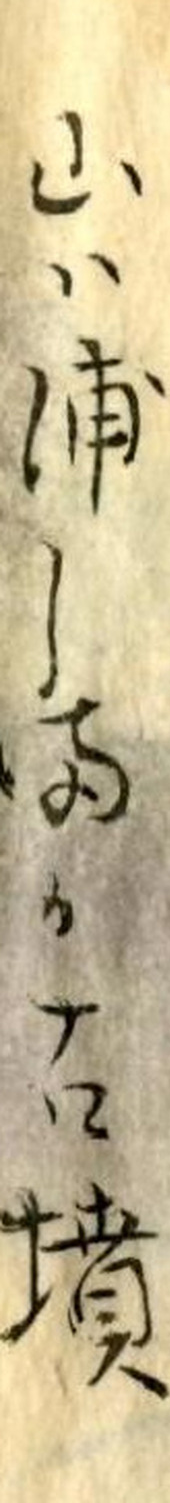山は浦しまか古墳
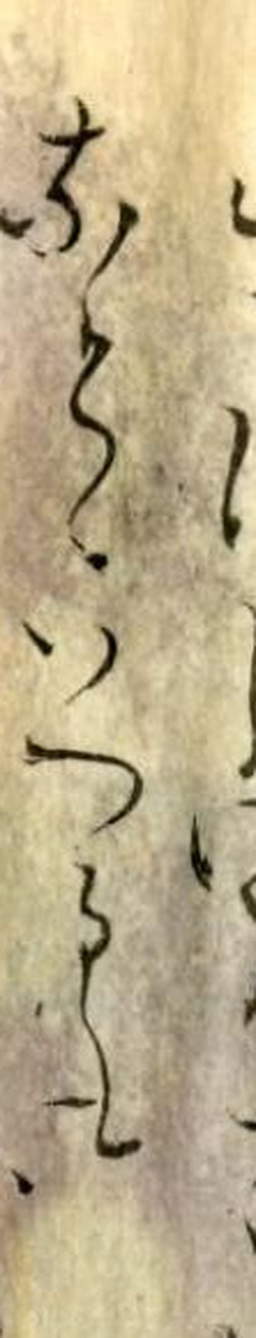なとゝいへるも
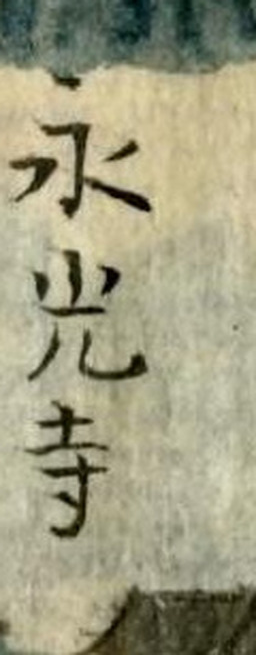永光寺
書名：能登めぐり
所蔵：Ishikawa Prefectural Library
